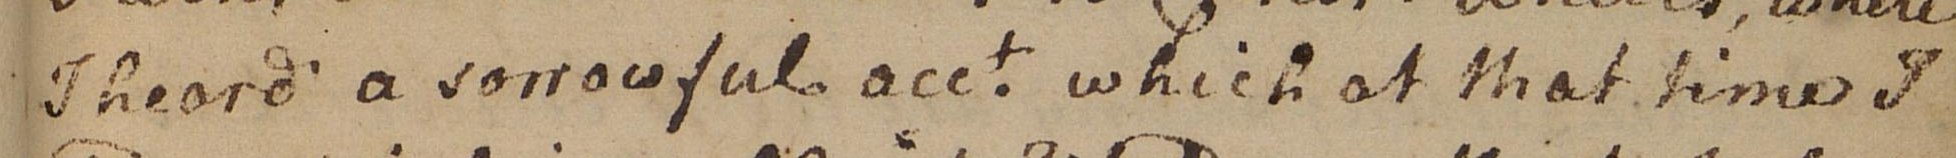I heard a sorrowful acc^t. which at that time I
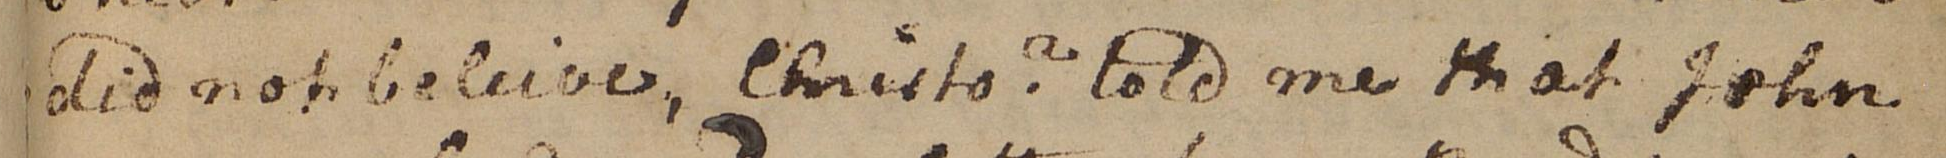did not beleive, Chisto^r. told me that John
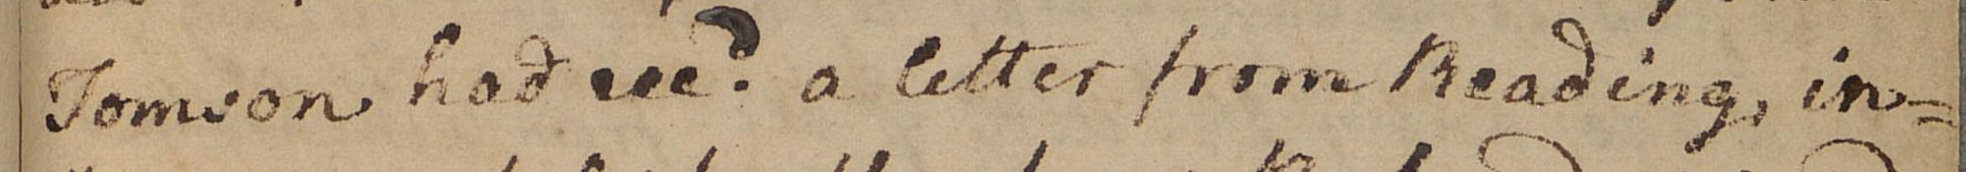Tomson had rec^d. a letter from Reading, in-
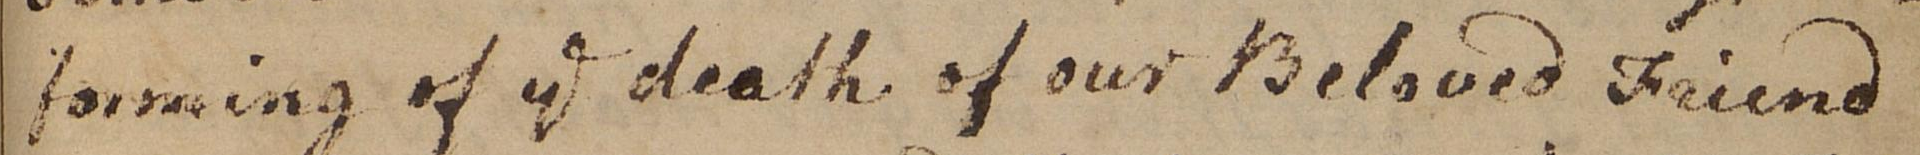forming of y^e death of our Beloved Friend
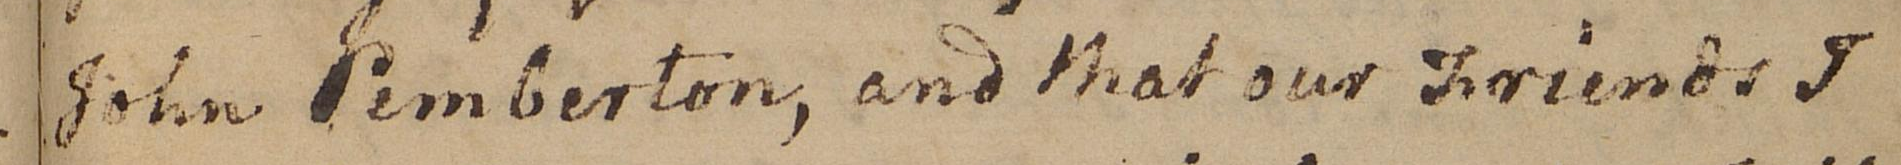John Pemberton, and that our Friends I
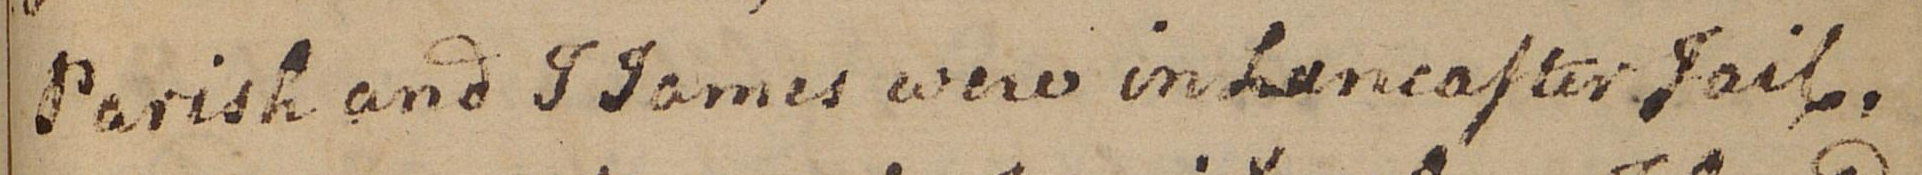Parish and I James were in Lancaster Jail,
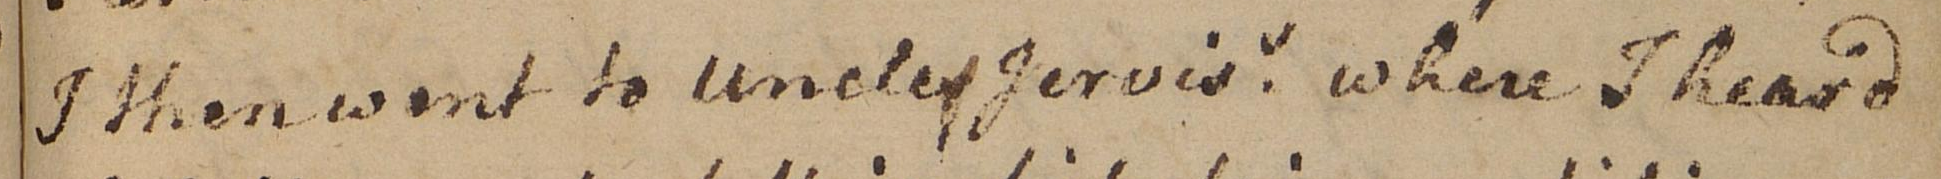I then went to Uncle Jervis^s. where I heard
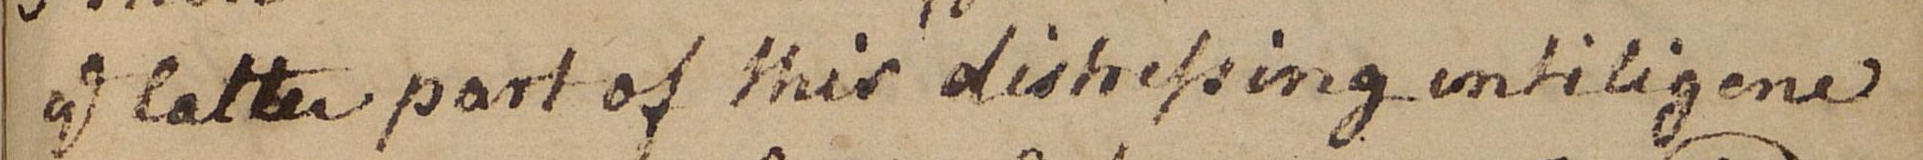y^e latter part of this distressing intiligene
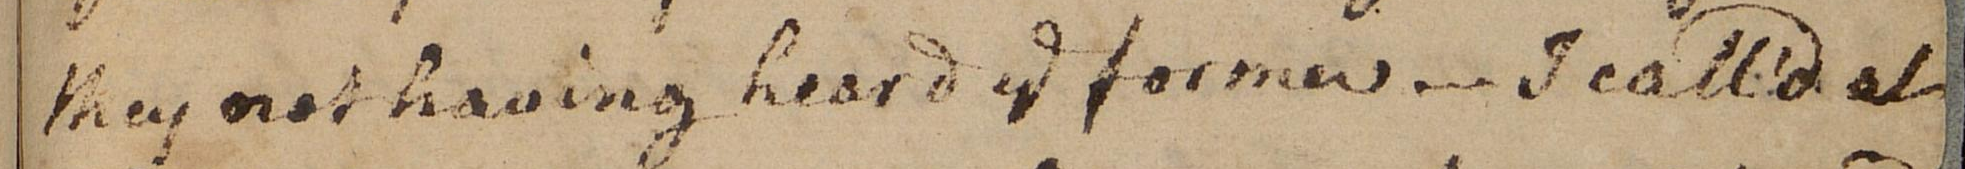they not having heard y^e former- I call'd at
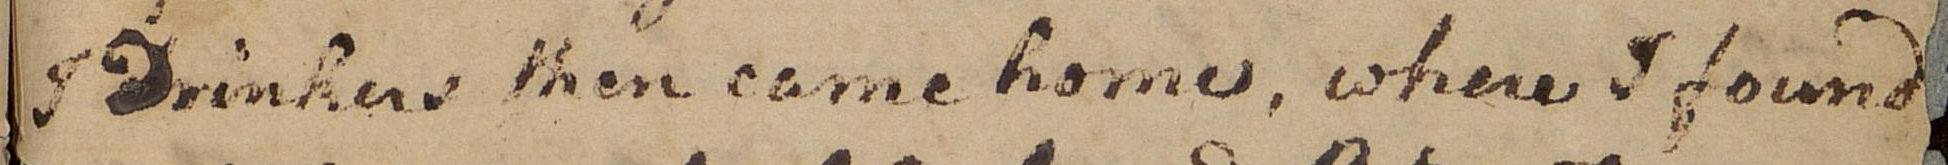I Drinkers then came home, where I found
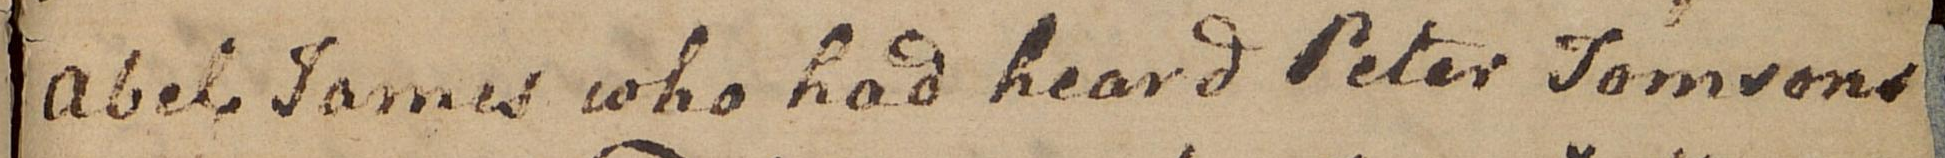Abel James who had heard Peter Samsons
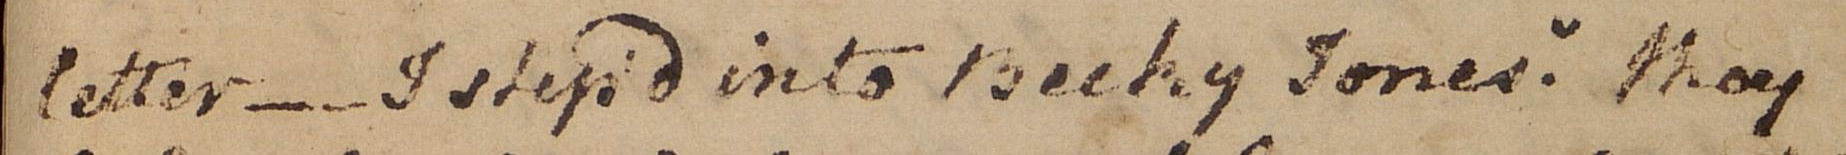letter- I step'd into Becky Jones^s. they
